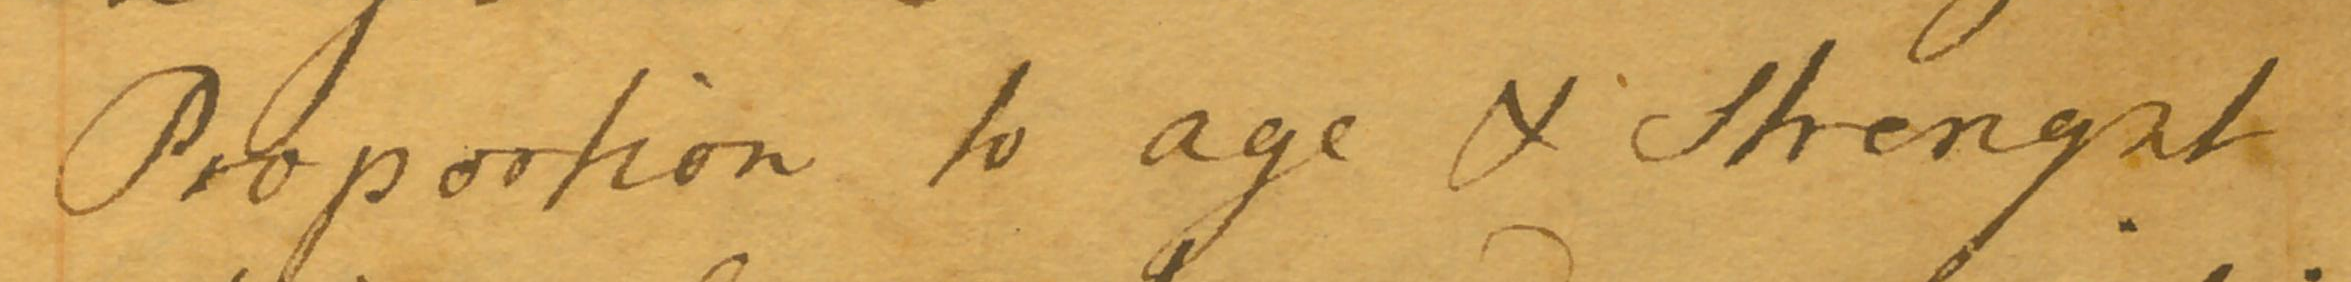Proportion to age & strenght
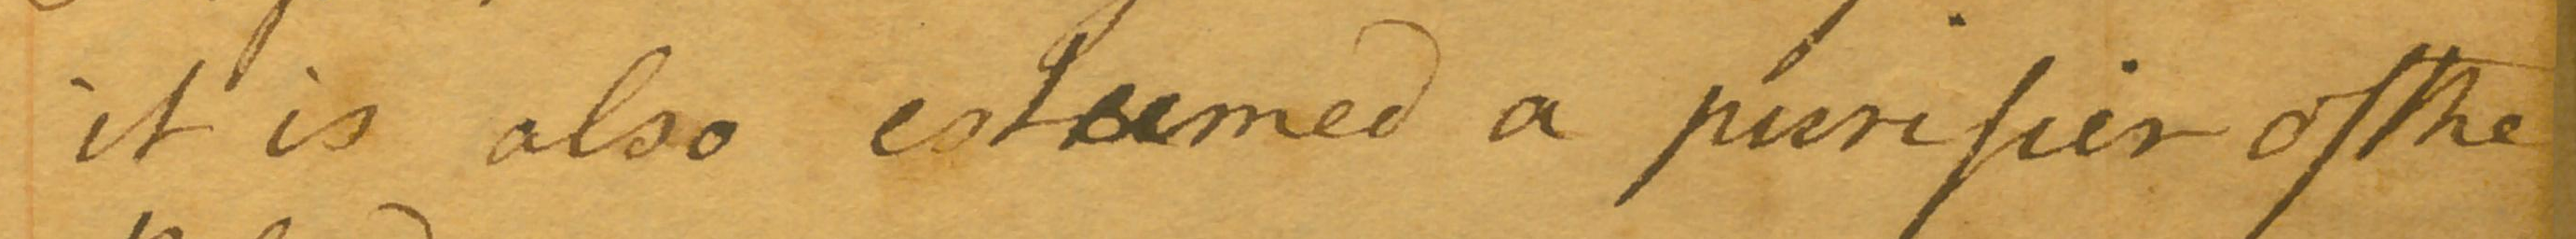it is also esteemed a purifier of the
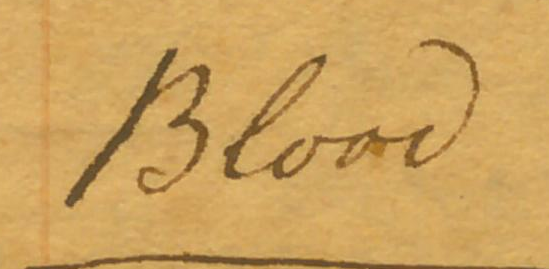Blood
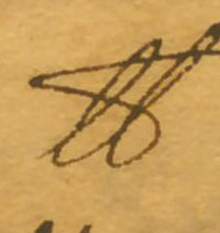lb
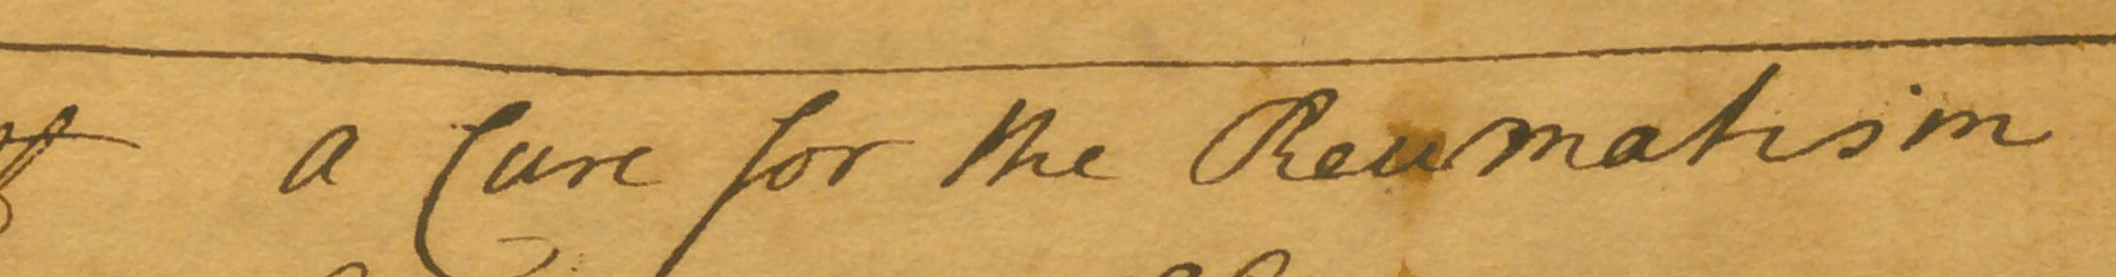a Cure for the Reumatism
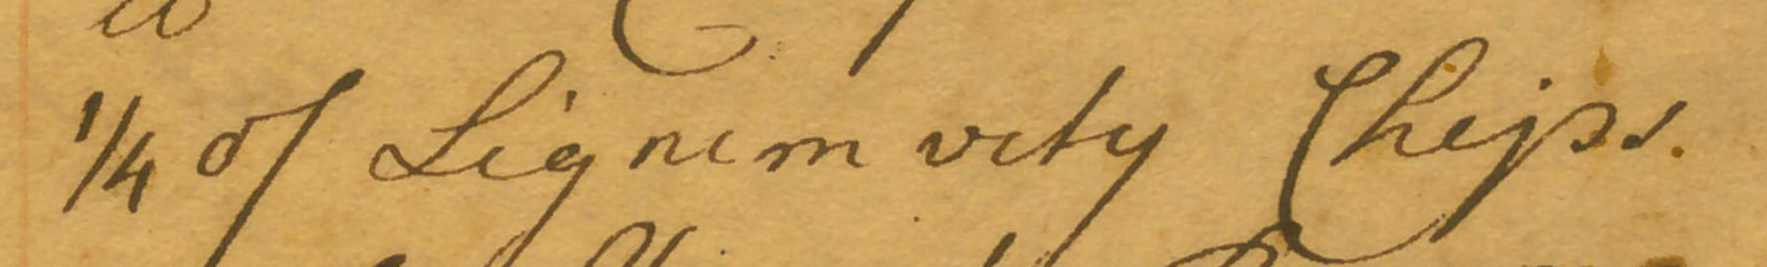1/4 of Lignim vity Chips
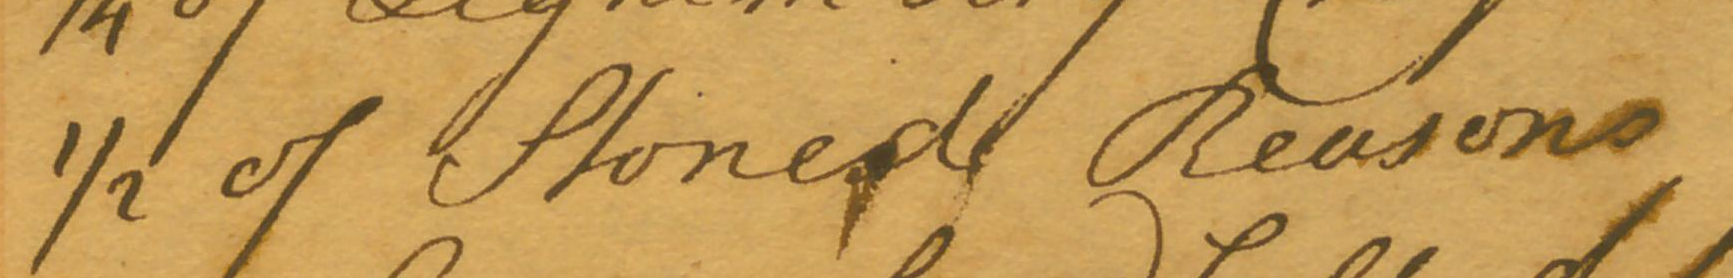1/2 of Stoned Reasons
